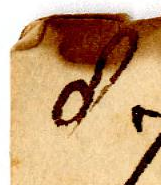8
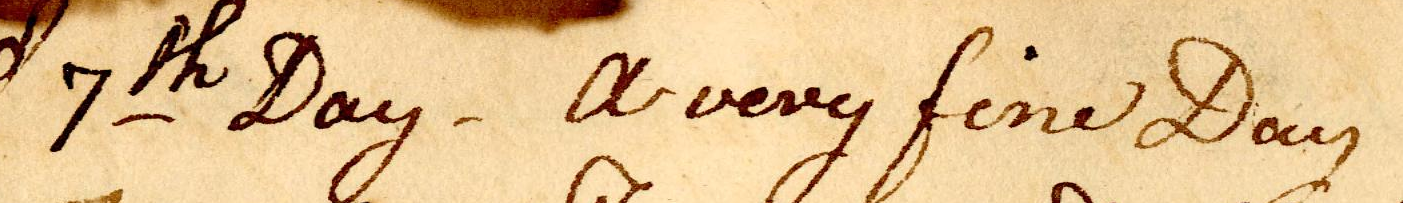7^th Day- A very fine Day
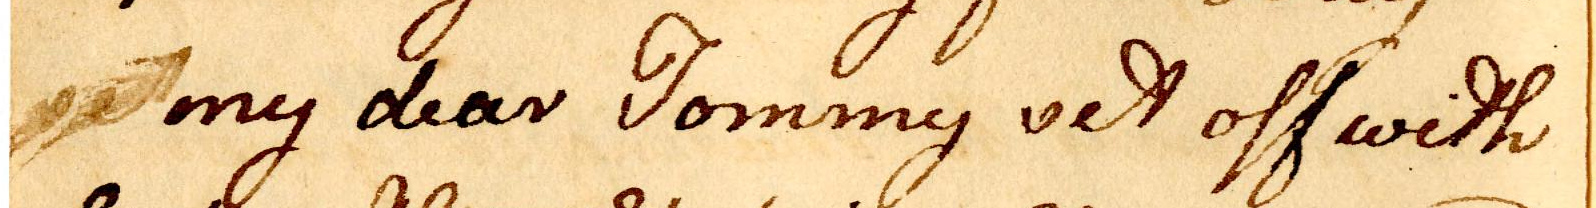my dear Tommy set off with
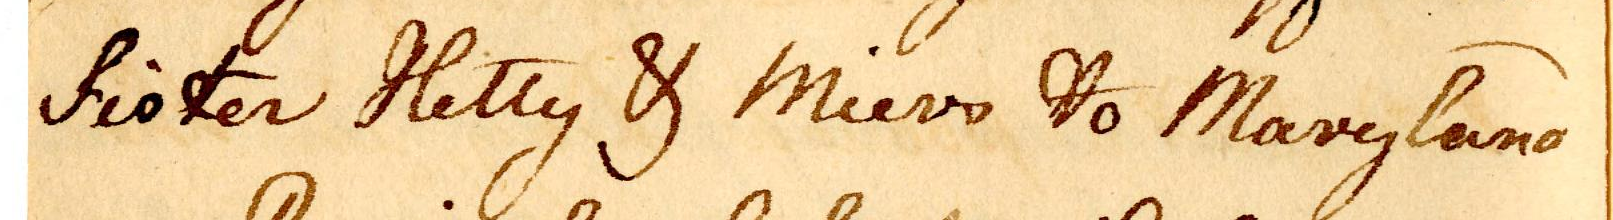Sister Hetty & Miers to Maryland
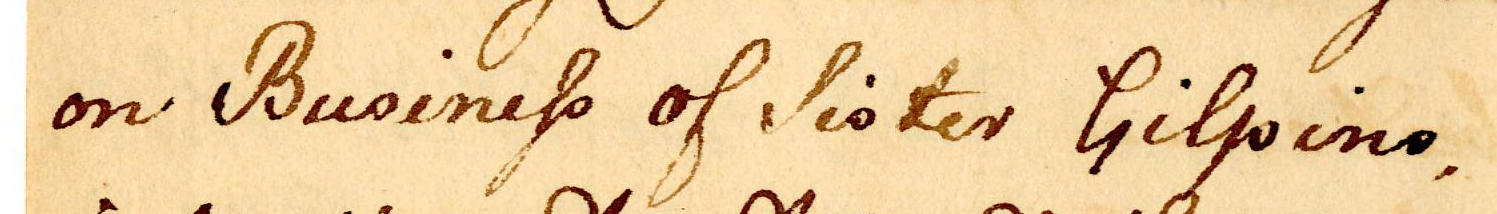on Business of Sister Gilpins,
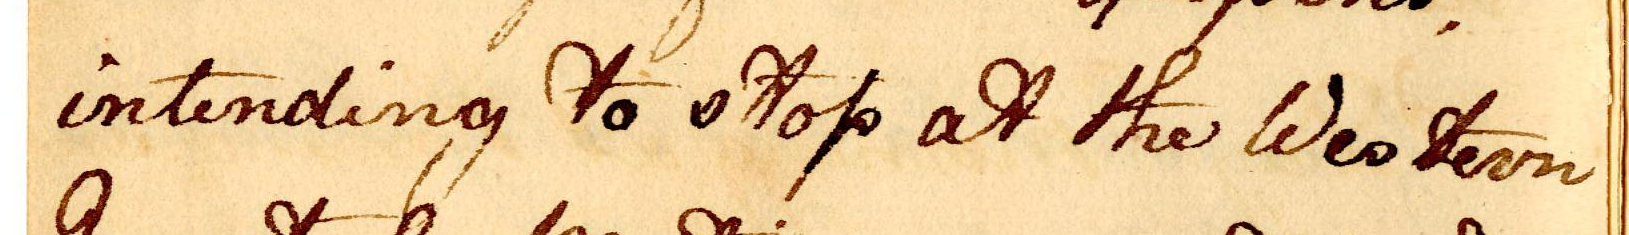intending to stop at the Western
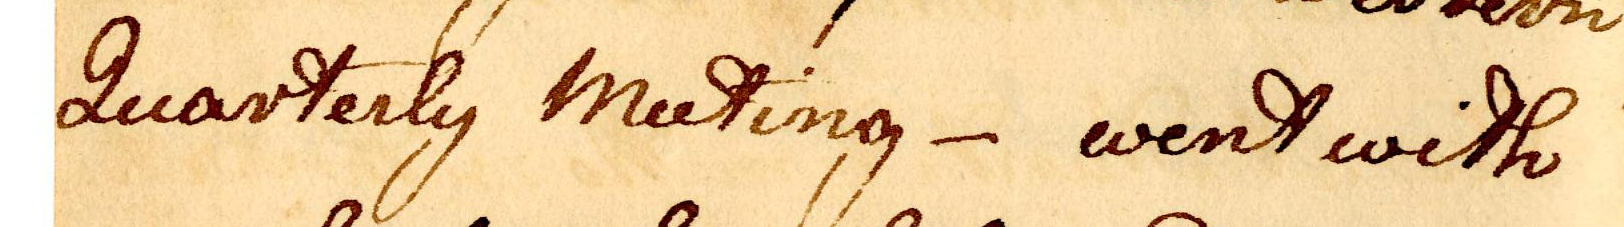Quarterly Meeting- went with
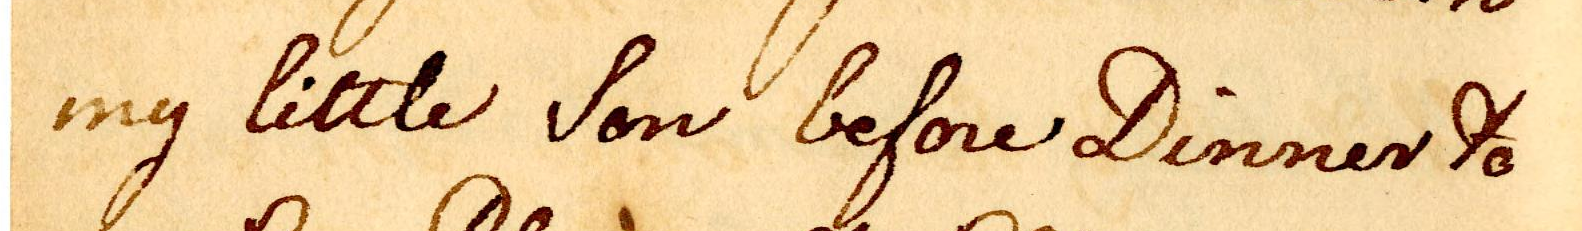my little Son before Dinner to
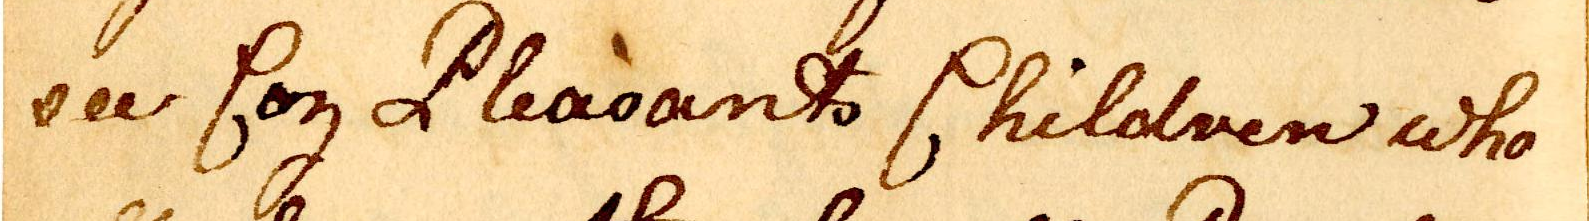see Coz Pleasants Children who
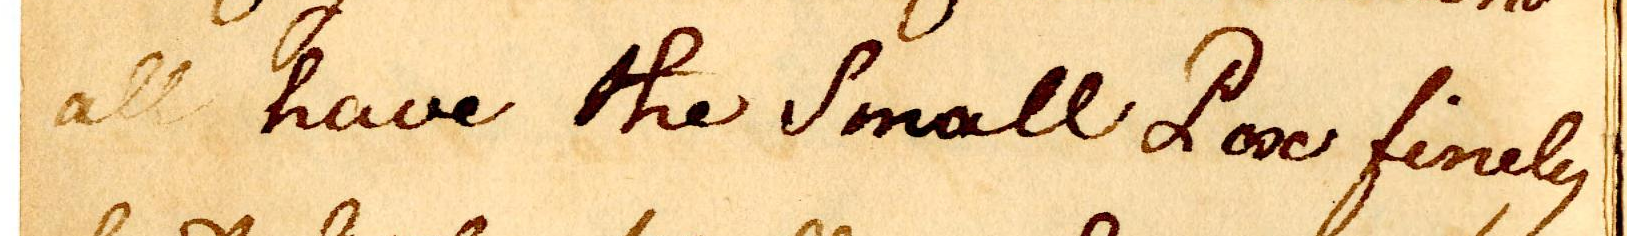all have the Small Pox finely
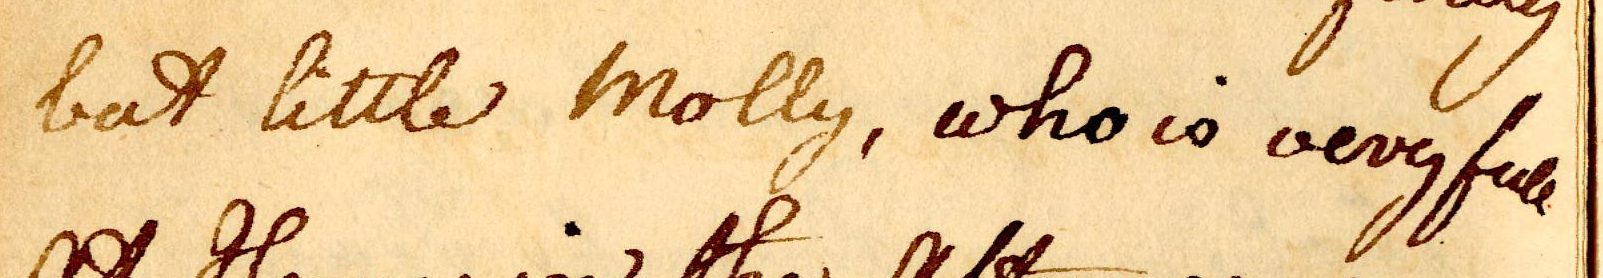but little Molly, who is very full
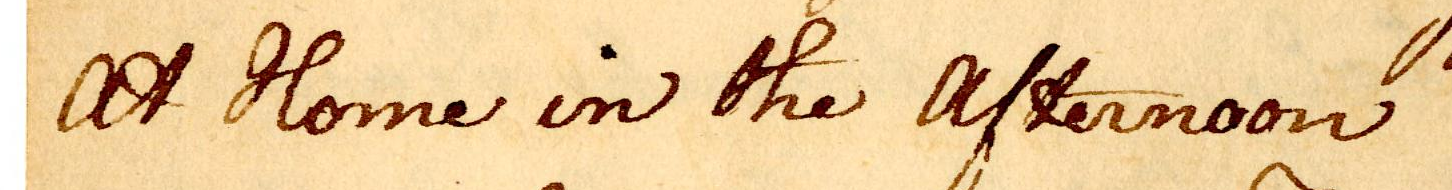At Home in the Afternoon
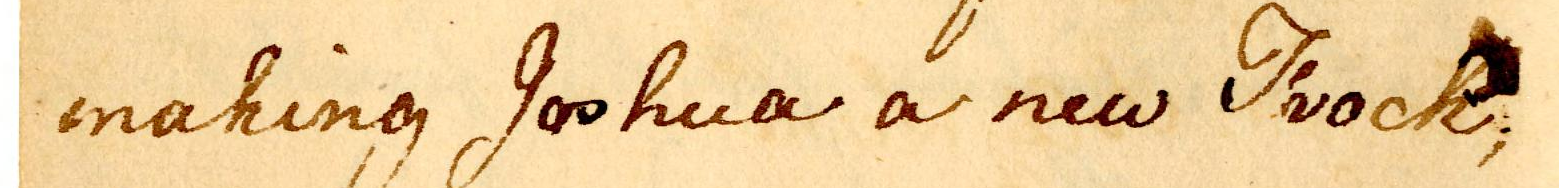making Joshua a new Frock,
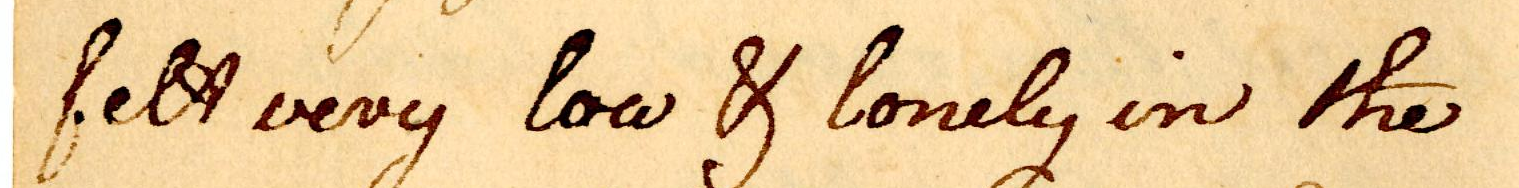felt very low & lonely in the
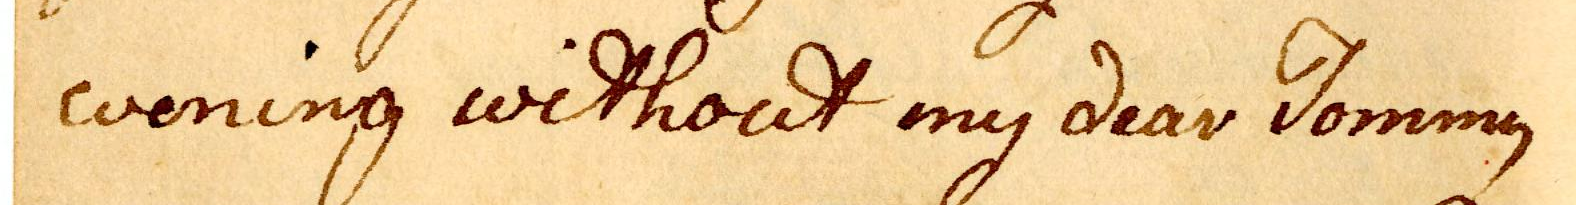evening without my dear Tommy
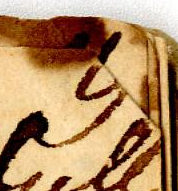9
